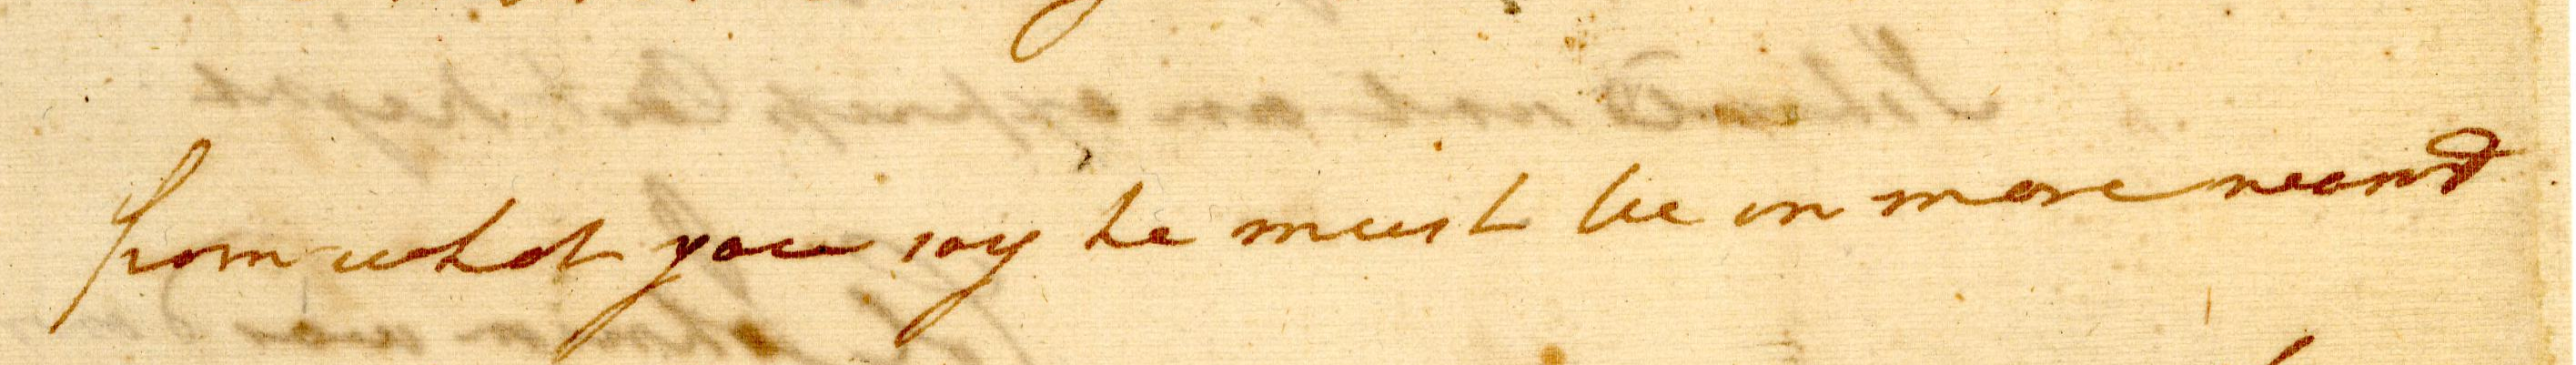from what you say he must lie in more want
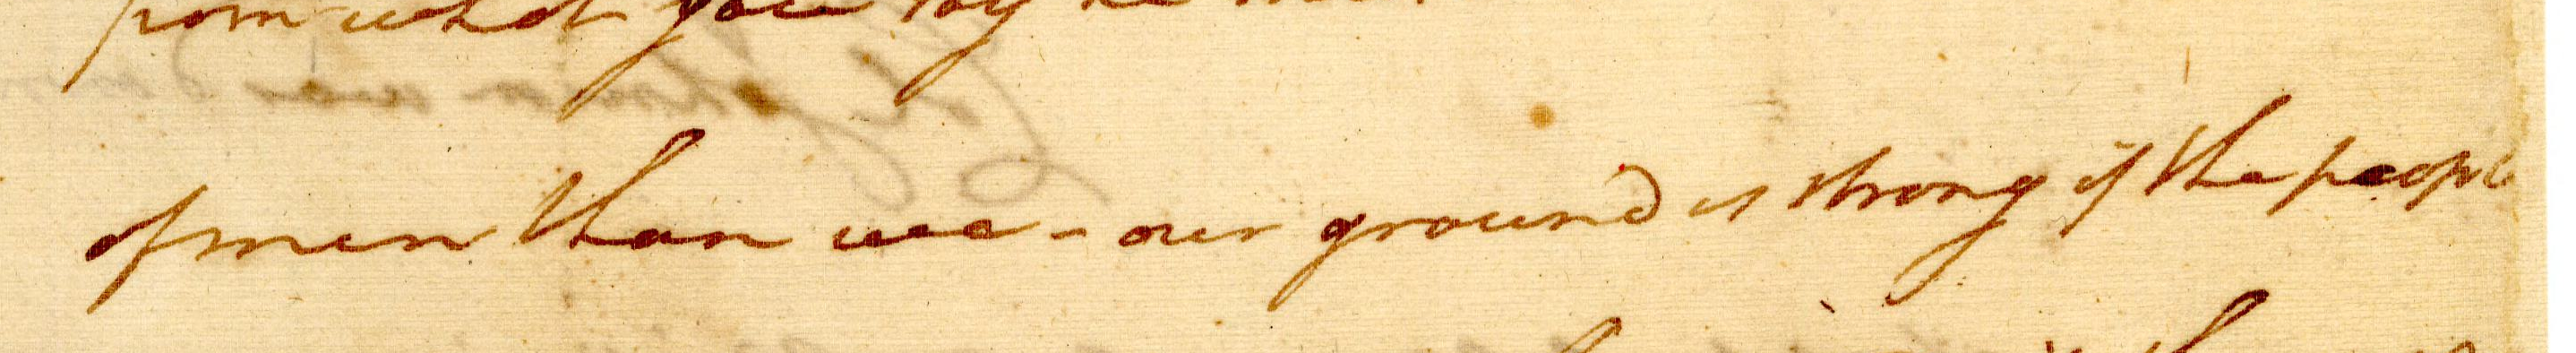of men than we- our ground is strong if the people
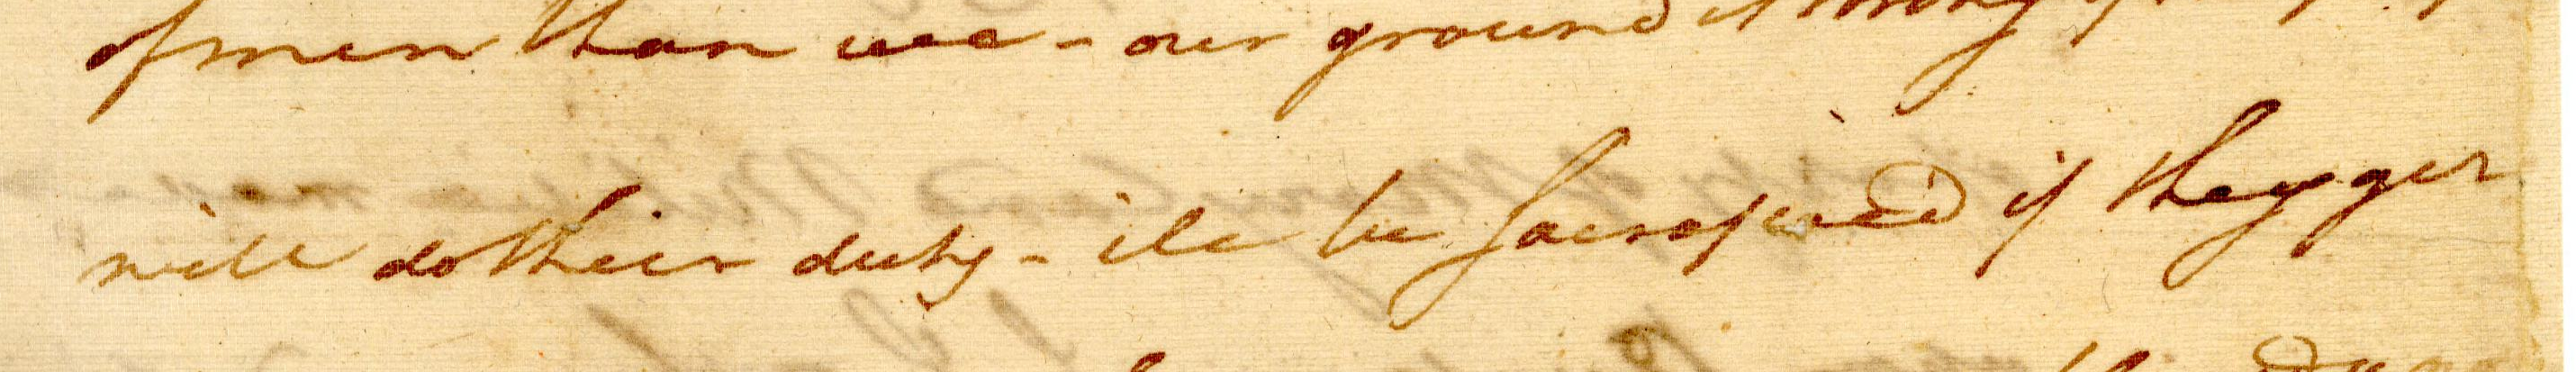will do their duty- ill be sacrific'd if they get
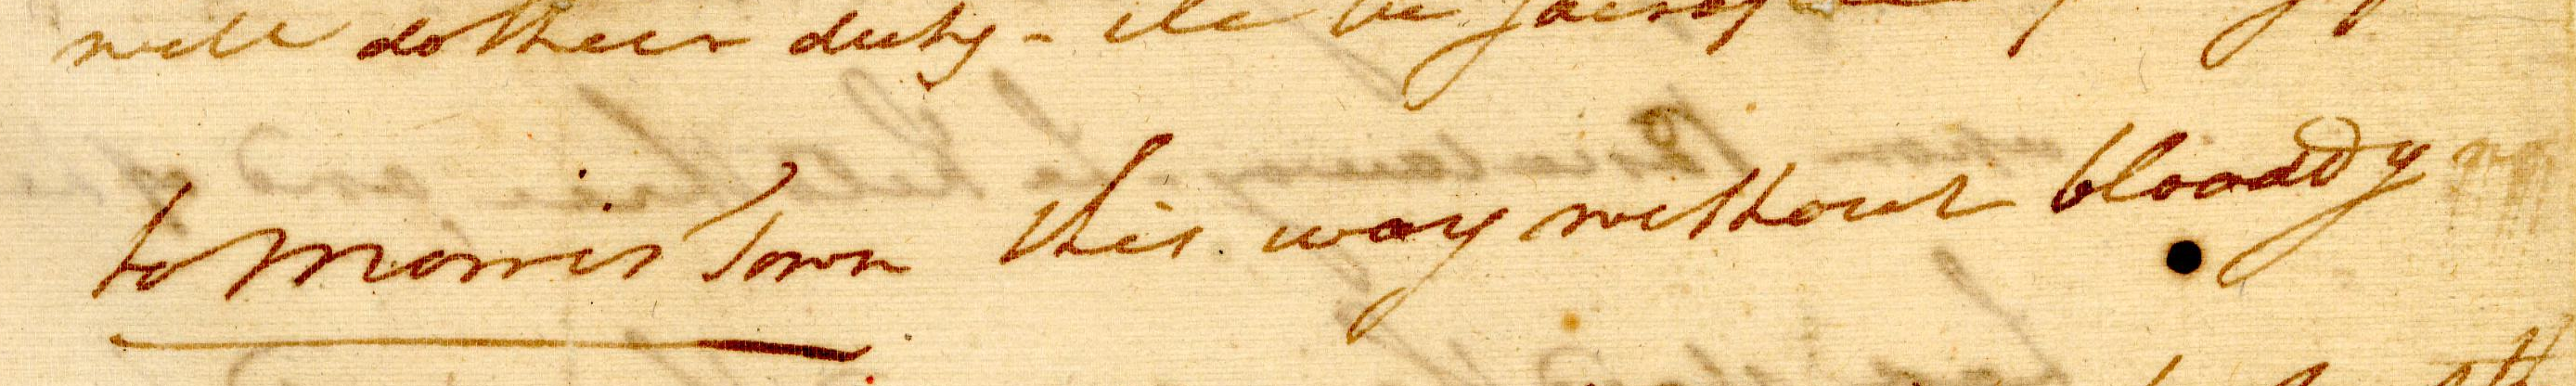to Morris Town this way without blooddy
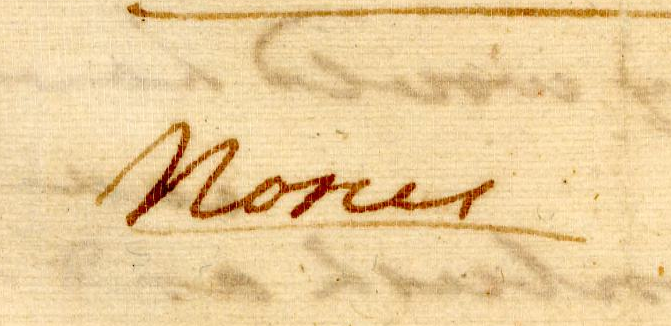noses
